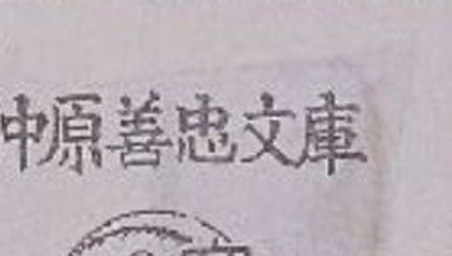「仲原善忠文庫
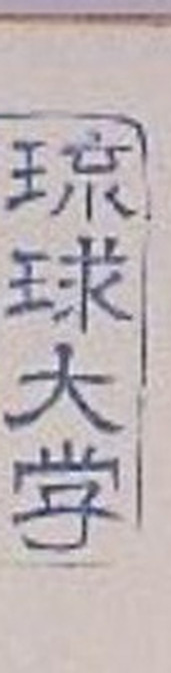琉球大学
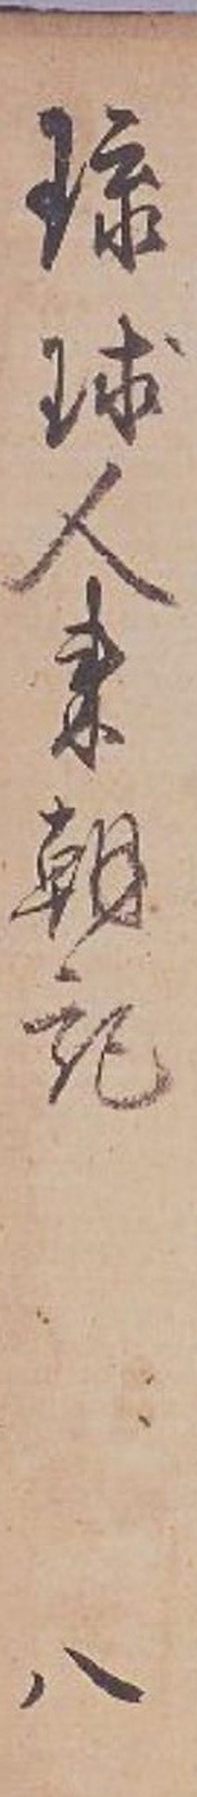琉球人来朝記八
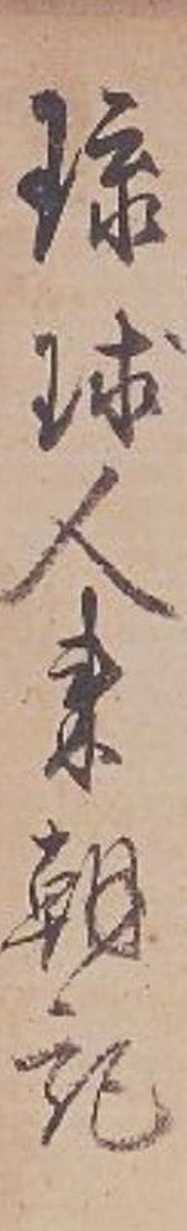琉球人来朝記八

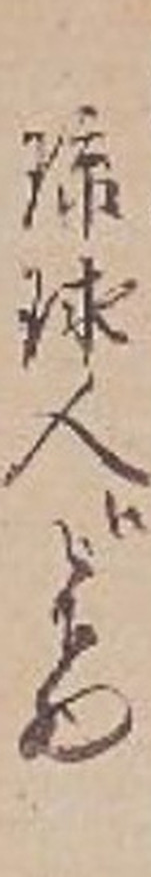琉球人え被下物

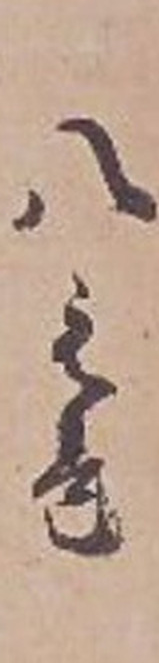八之巻
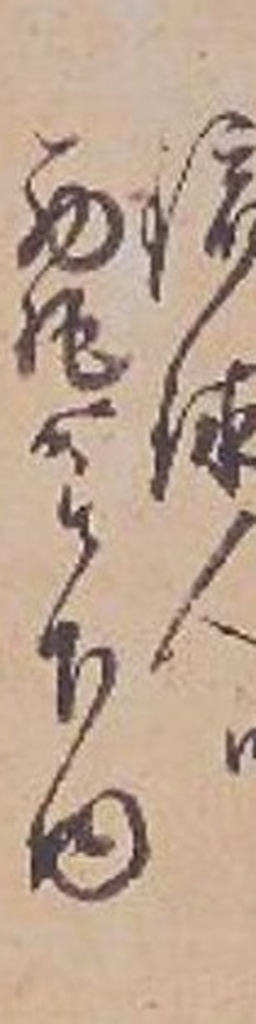西丸に而被下物
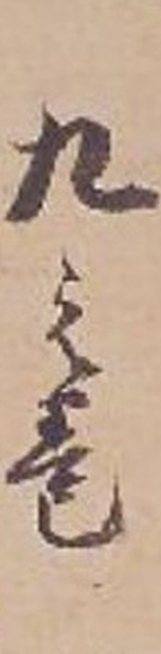九之巻
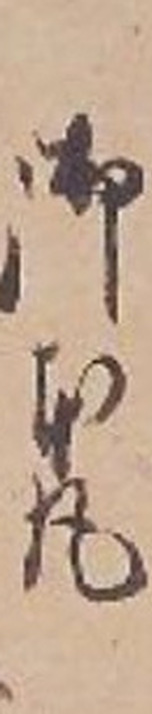御本丸
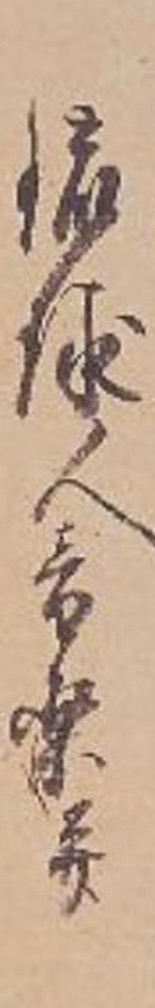琉球人音楽幷
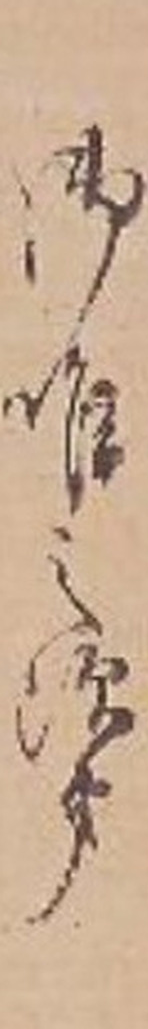御候之次第
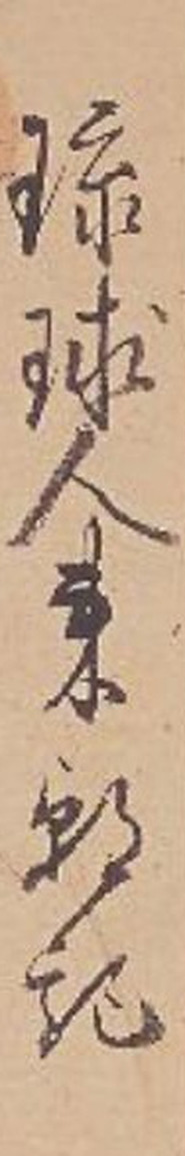琉球人来朝記
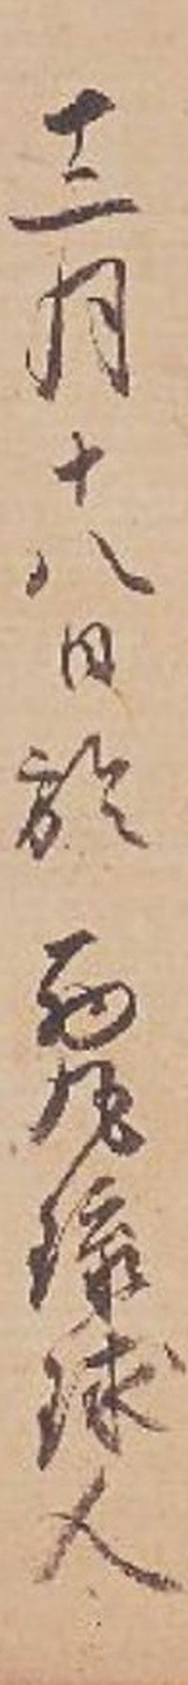十二月十八日於西丸琉球人
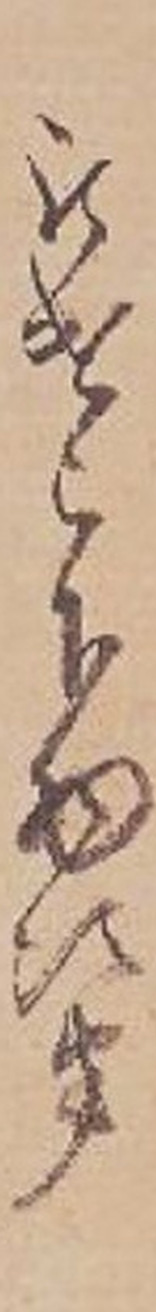被遣被下物次第
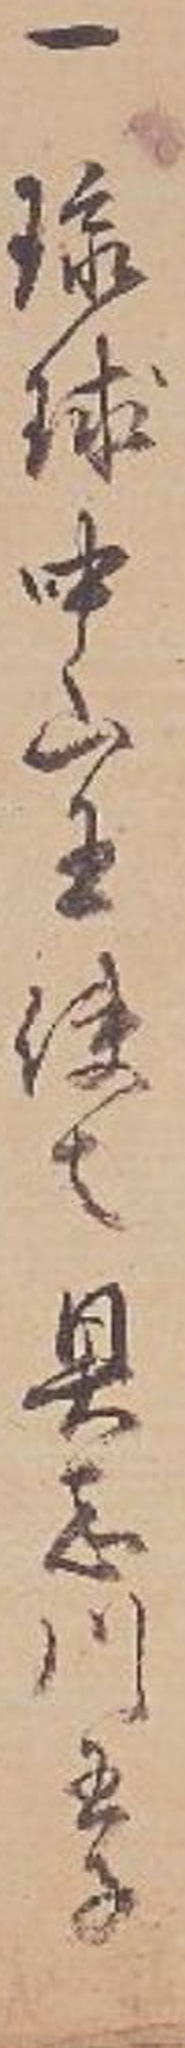一琉球中山王使者具志川王子
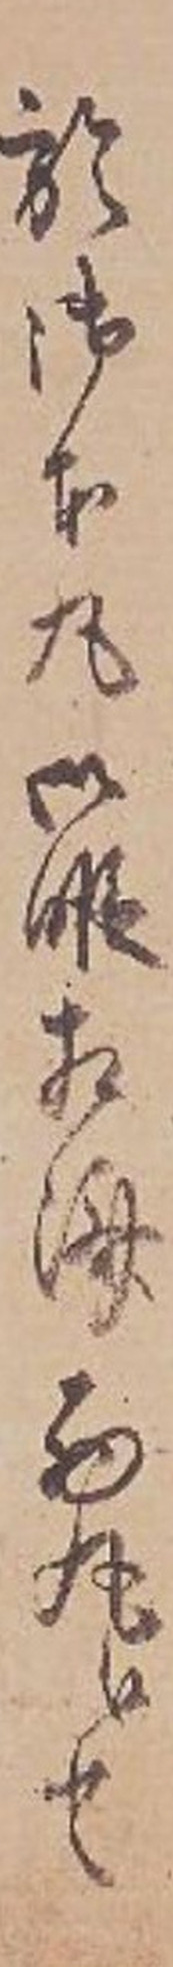於御本丸御暇相済西丸え登
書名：琉球人来朝記 八、九
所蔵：University of the Ryukyus Library
